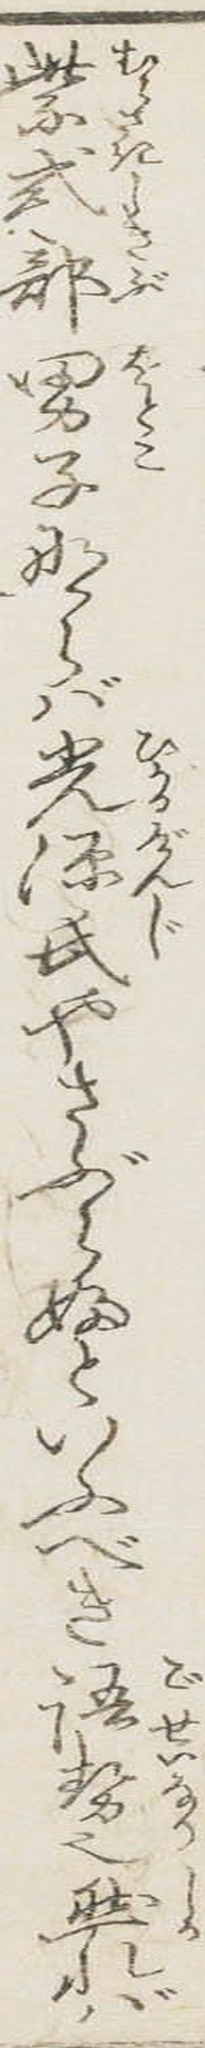紫式部男子ならば光源氏やさぶらふといふべき語勢也然れば
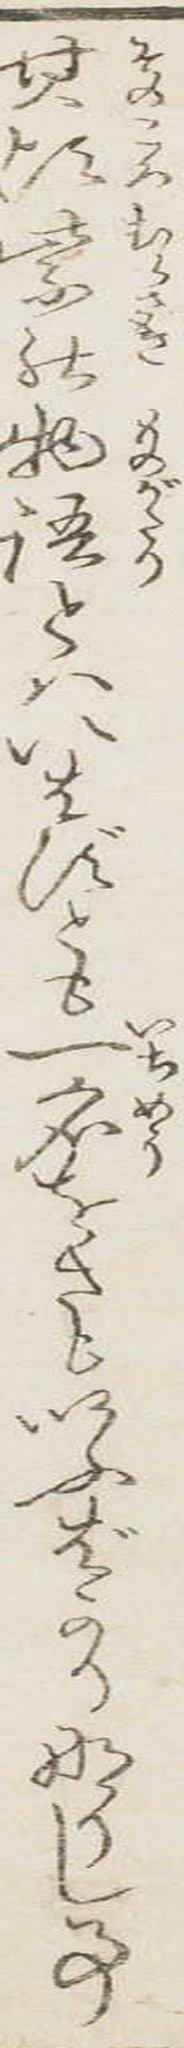其頃紫の物語とはいはずとも一名をさもいふばかりなりし事
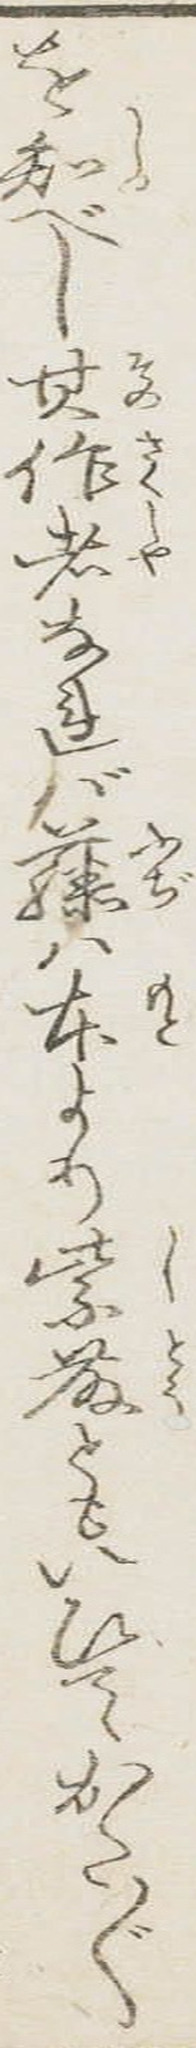を知べし其作者なれば藤は本より紫藤ともいひてかた〴〵
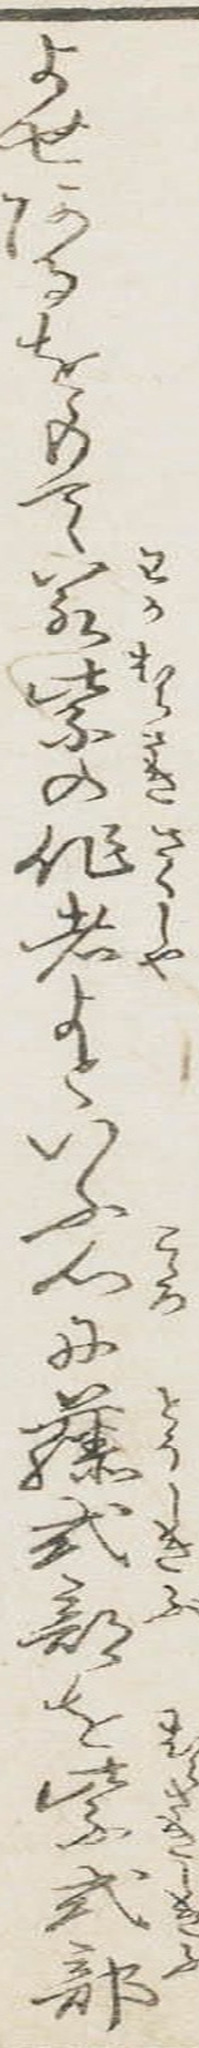よせあるをもて若紫の作者よといふ心に藤式部を紫式部
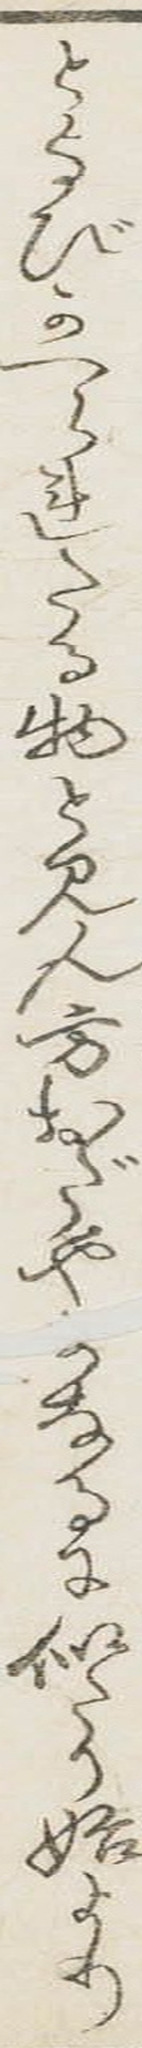とよびかへられたる物と見ん方おだやかなるに似たり始より
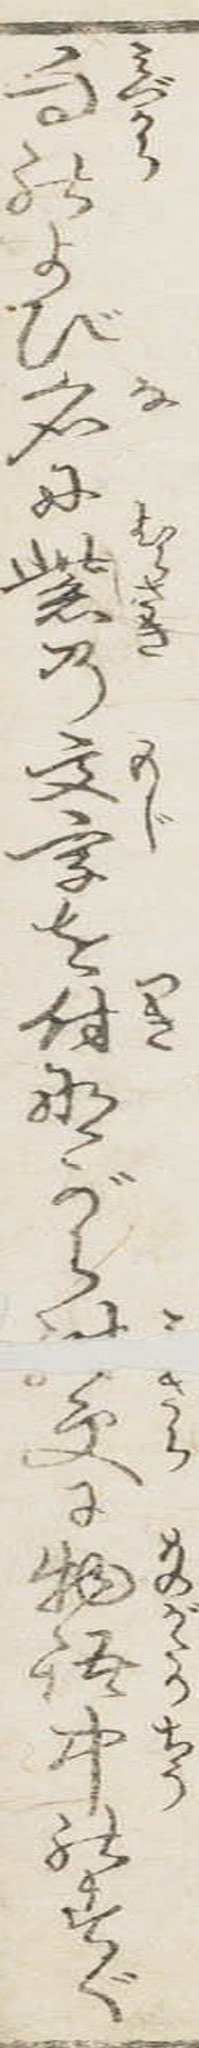自のよび名に紫の文字を付ながら殊更に物語中のすぐ
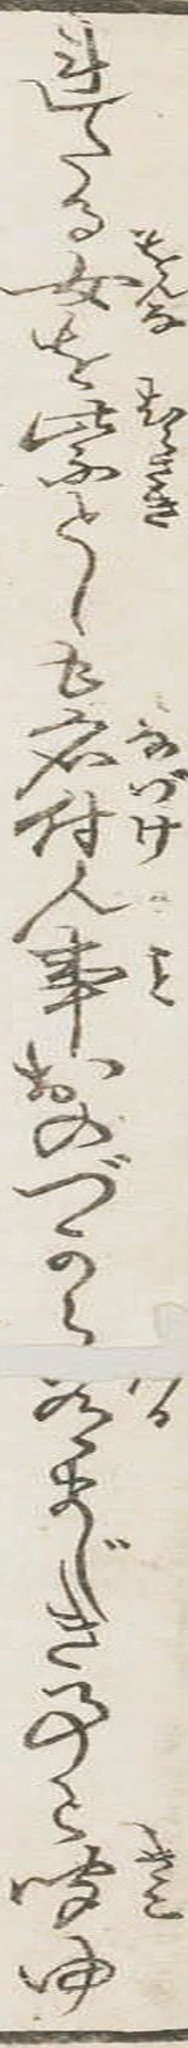れたる女を紫としも名付ん事おのづから有まじき事と聞ゆ
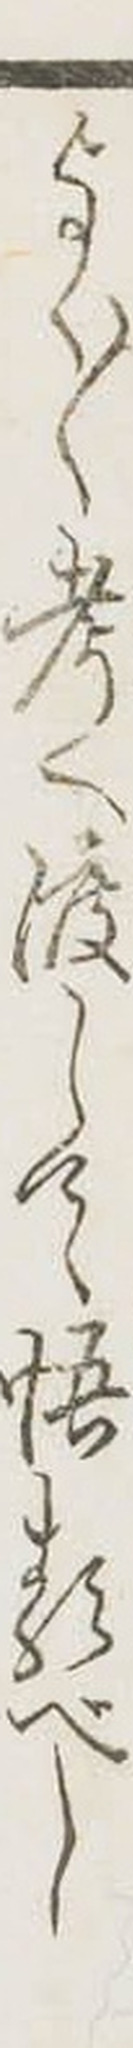よく〳〵考へ渡して悟るべし
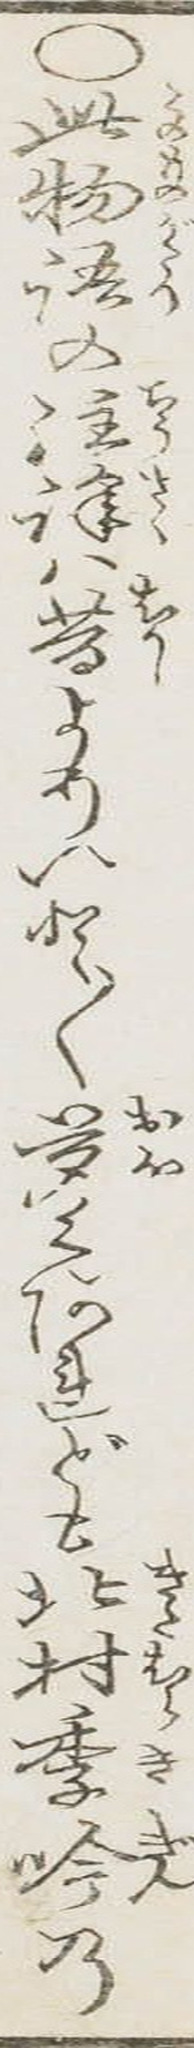○此物語の注訳は昔よりいと〳〵多くあれども北村季吟の
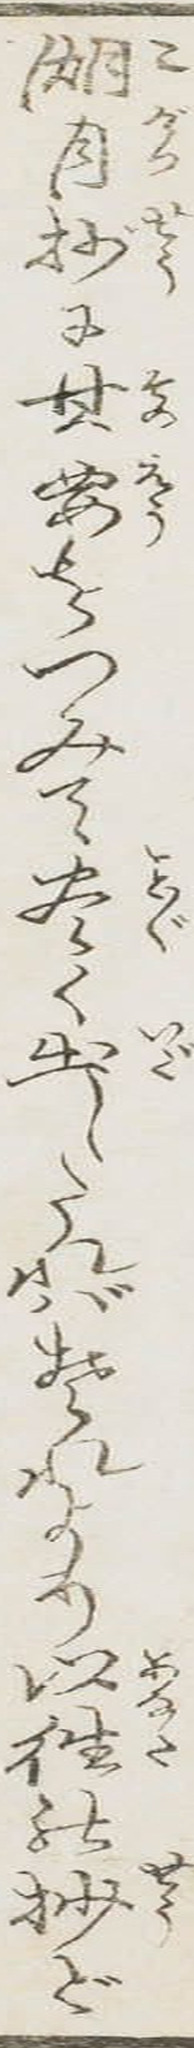湖月抄に其要をつみて尽く出したればそれより以往の抄ど
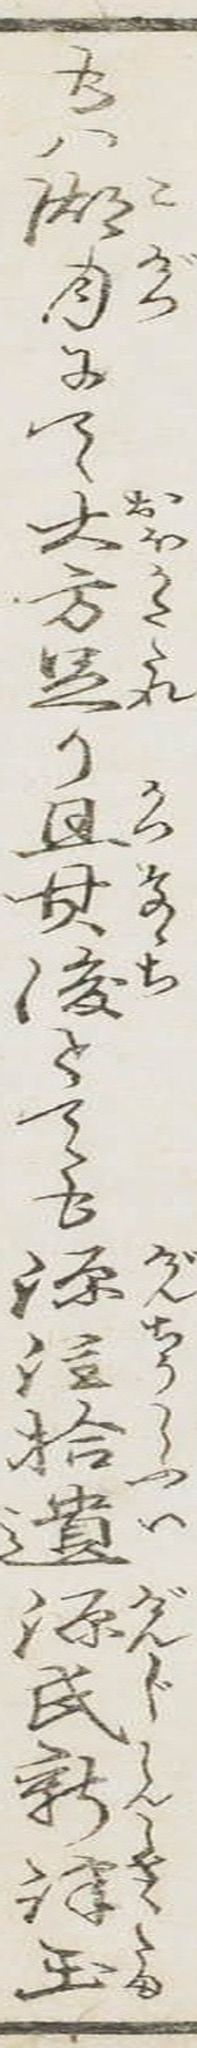もは湖月にて大方足り且其後とても源注拾遺源氏新訳玉
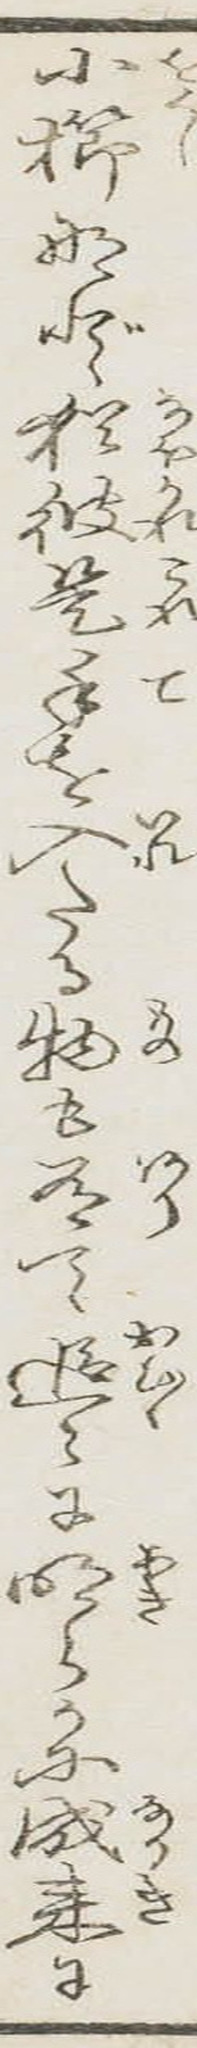小櫛など猶彼是手を入たる物も有て追々に明らかに成来に
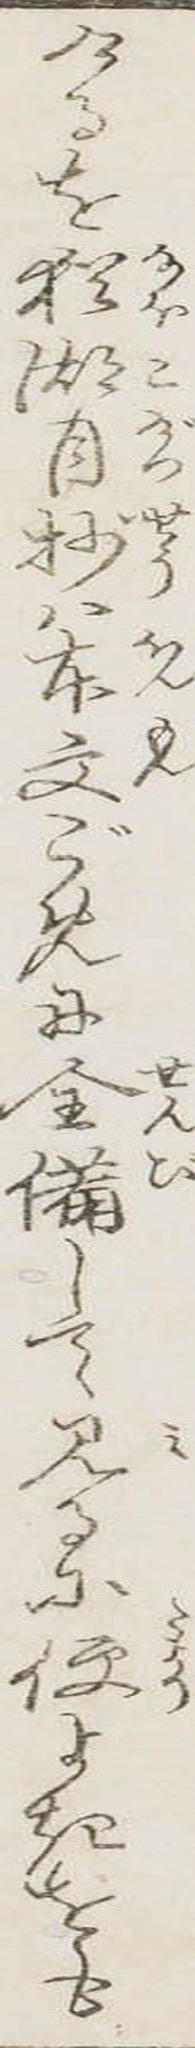けるを猶湖月抄は本文ご免に全備して見るに便よきをも
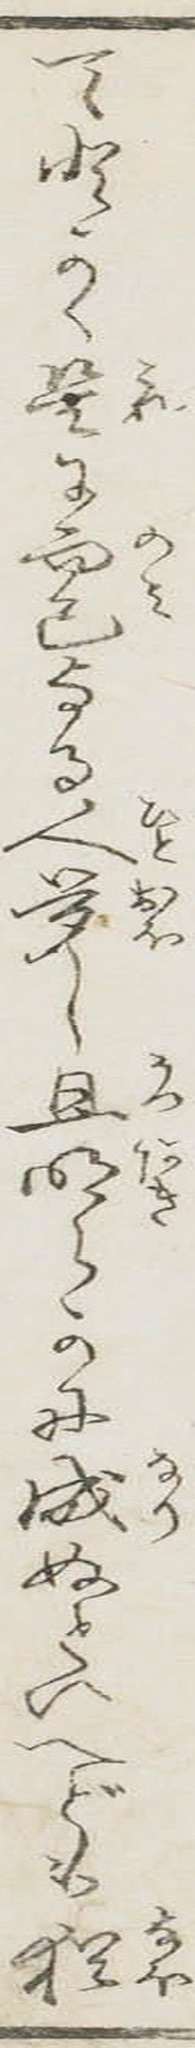てとかく是に而已よる人多し且明らかに成ぬといへども猶
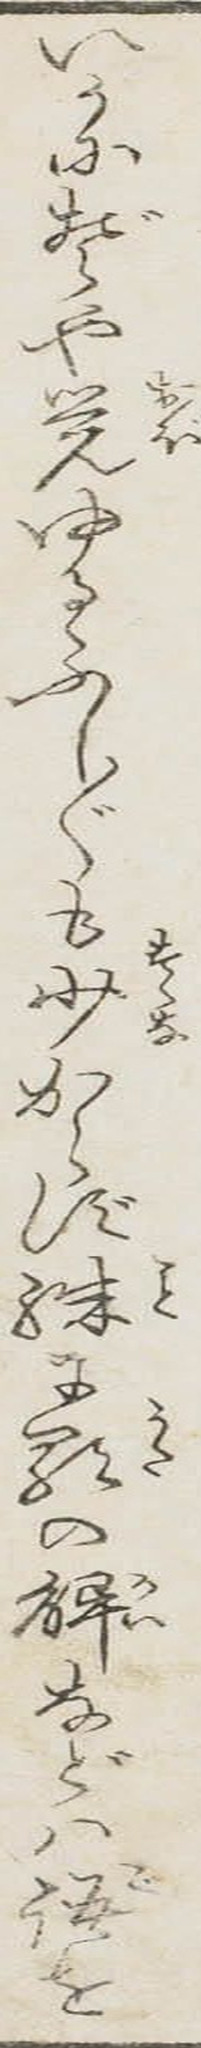いかにぞや覚ゆるふし〴〵も少からず殊に歌の解などは語を
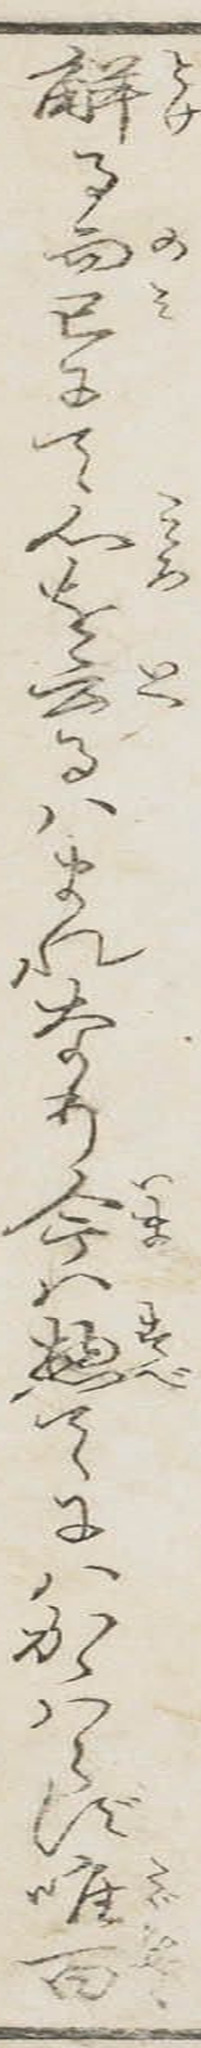解る而已にて心を云るはまれなり今は総てにはかゝはらず唯百
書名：源氏百人一首
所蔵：東京学芸大学教育コンテンツアーカイブ
